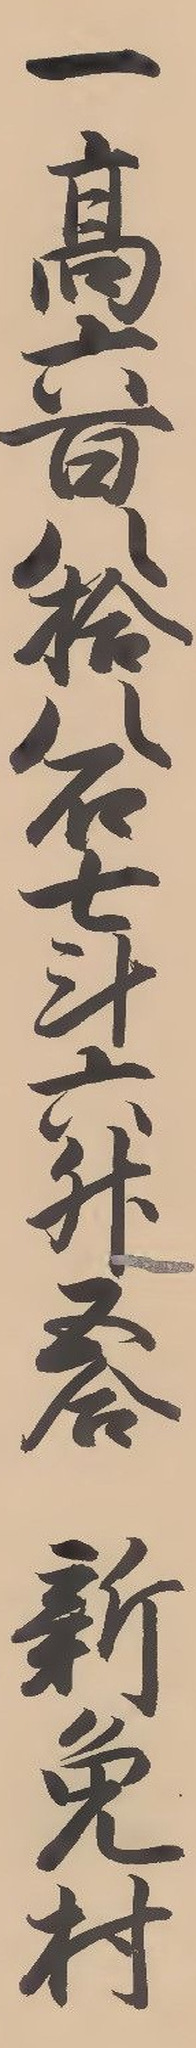一高六百八拾八石七斗六升五合新免村
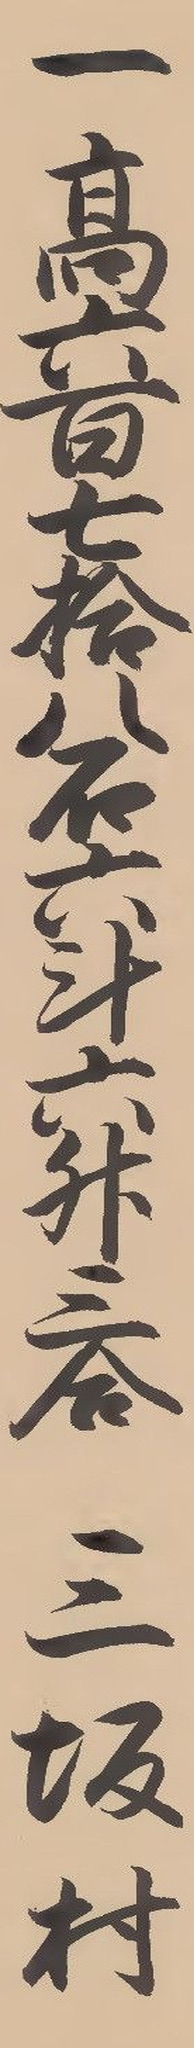一高六百七拾八石六斗六升三合三坂村
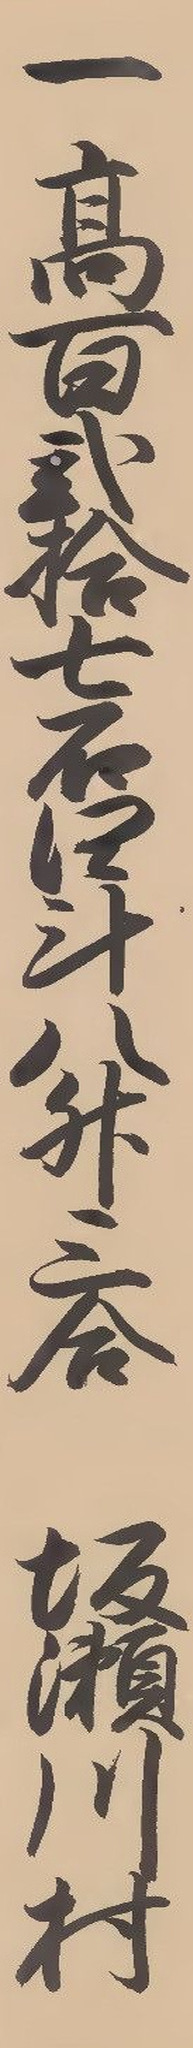一高百弐拾七石四斗八升三合坂瀬川村
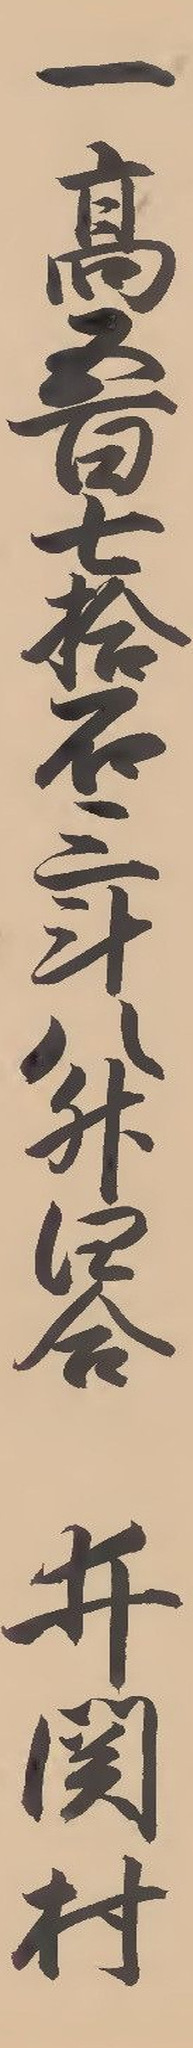一高五百七拾石三斗八升四合井関村
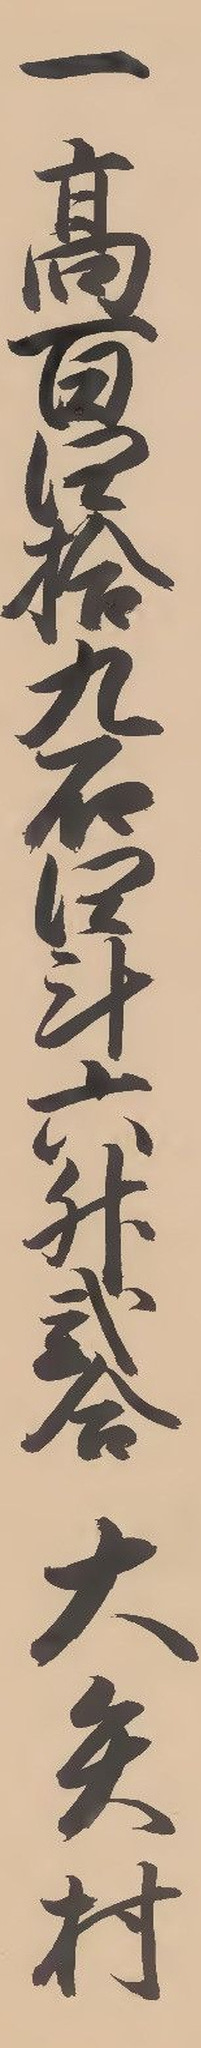一高百四拾九石四斗六升弐合大矢村
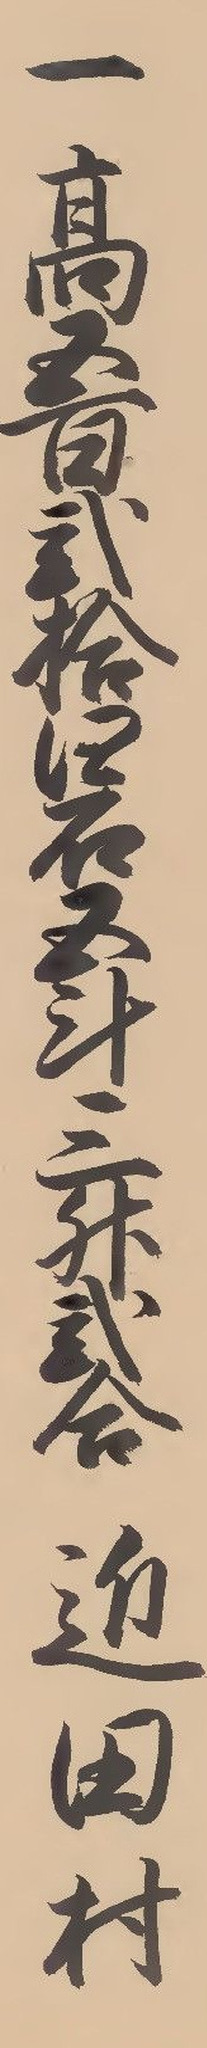一高五百弐拾四石五斗三升弐合近田村
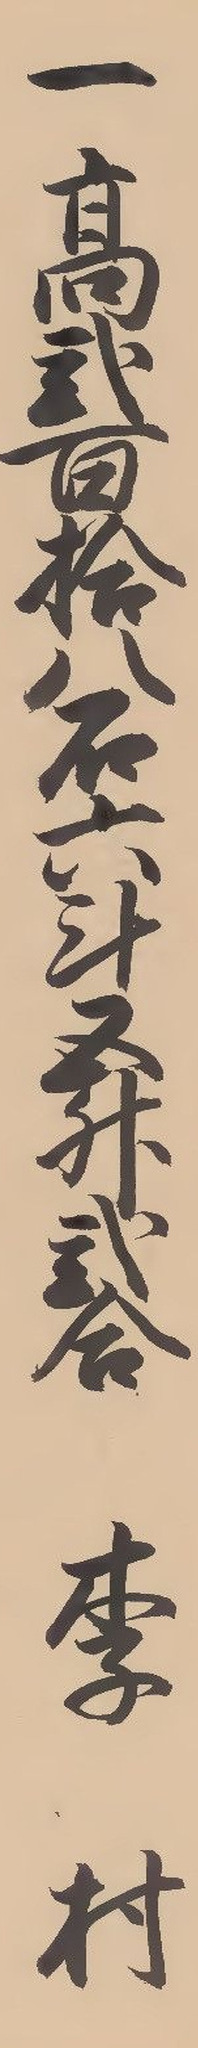一高弐百拾八石六斗五升弐合李村
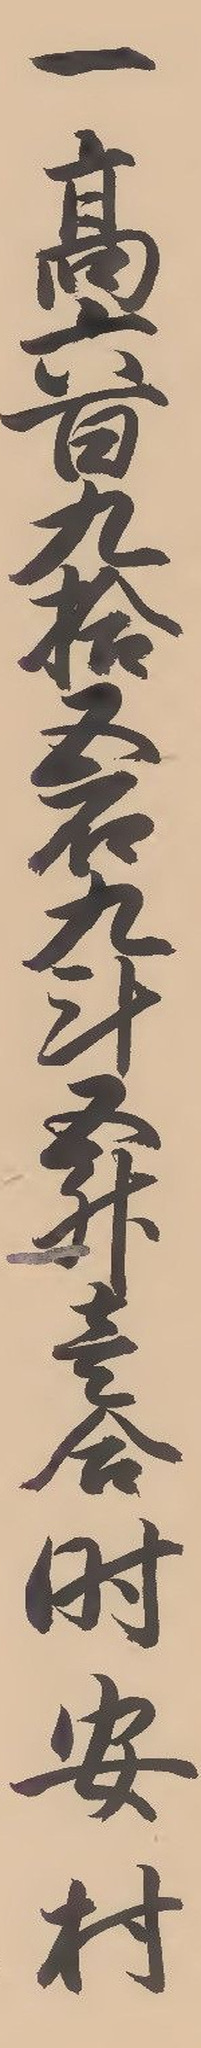一高六百九拾五石九斗五升壱合時安村

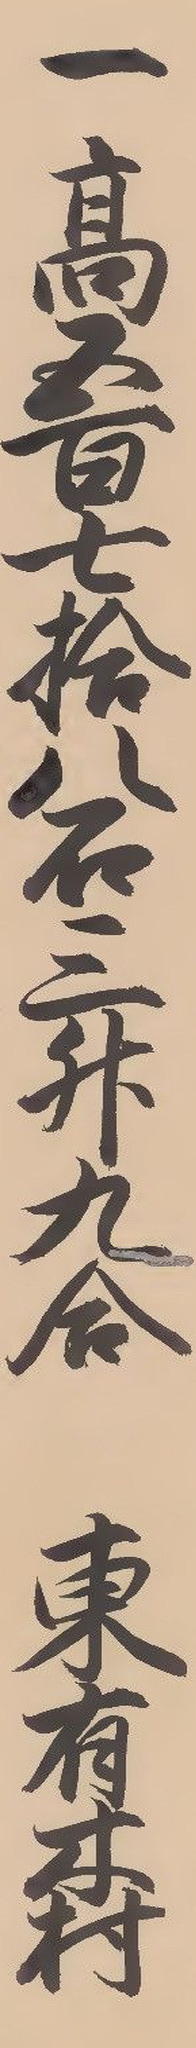一高五百七拾八石三升九合東有木村
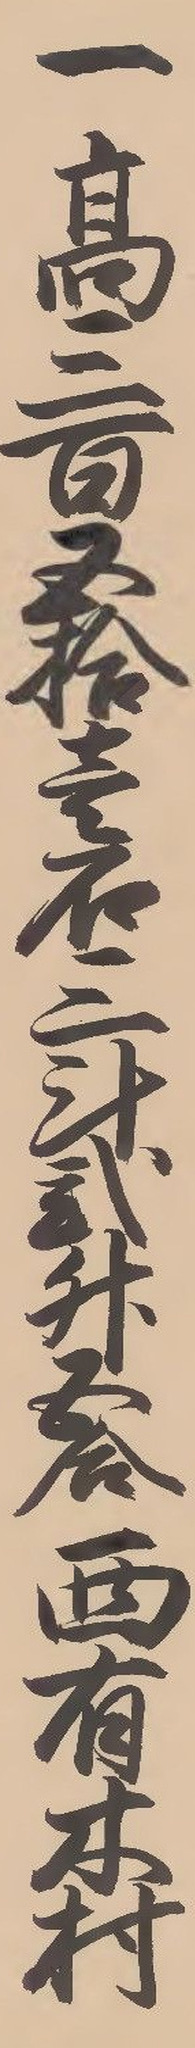一高三百五拾壱石三斗弐升五合西有木村
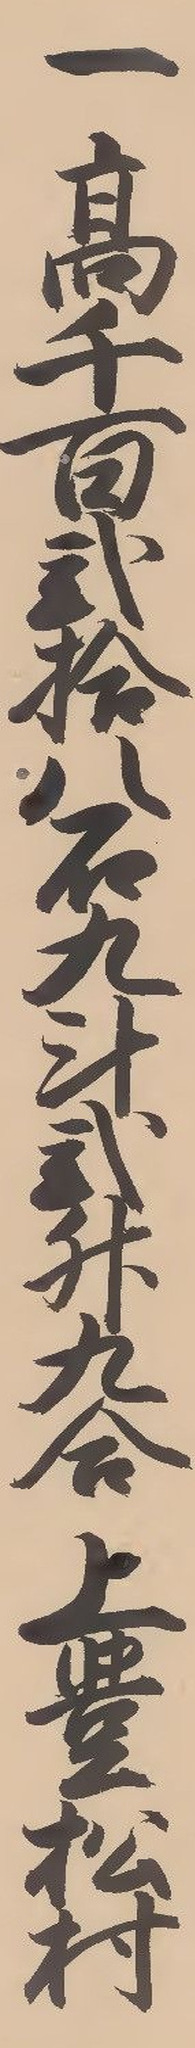一高千百弐拾八石九斗弐升九合上豊松村
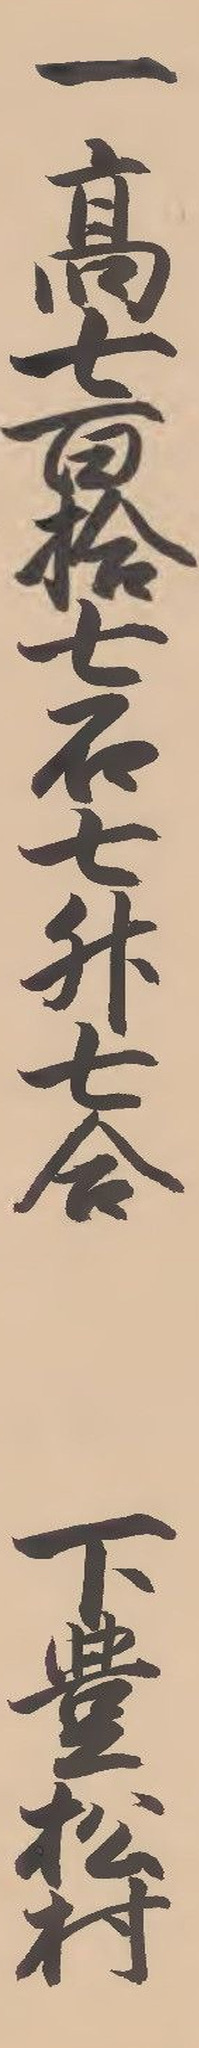一高七百拾七石七升七合下豊松村
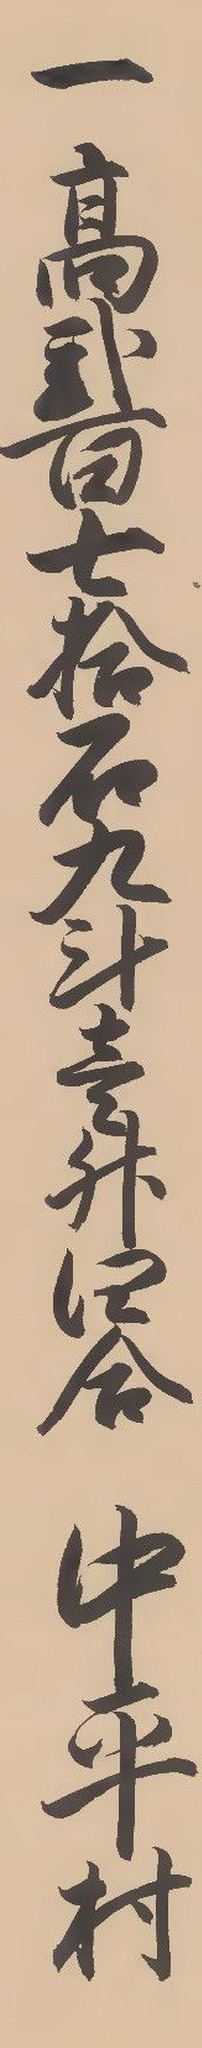一高弐百七拾石九斗壱升四合中平村
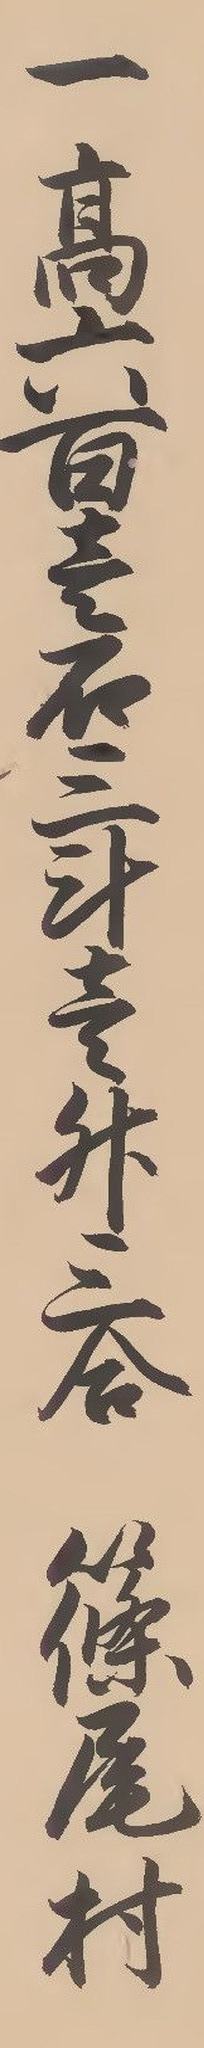一高六百壱石三斗壱升三合篠尾村
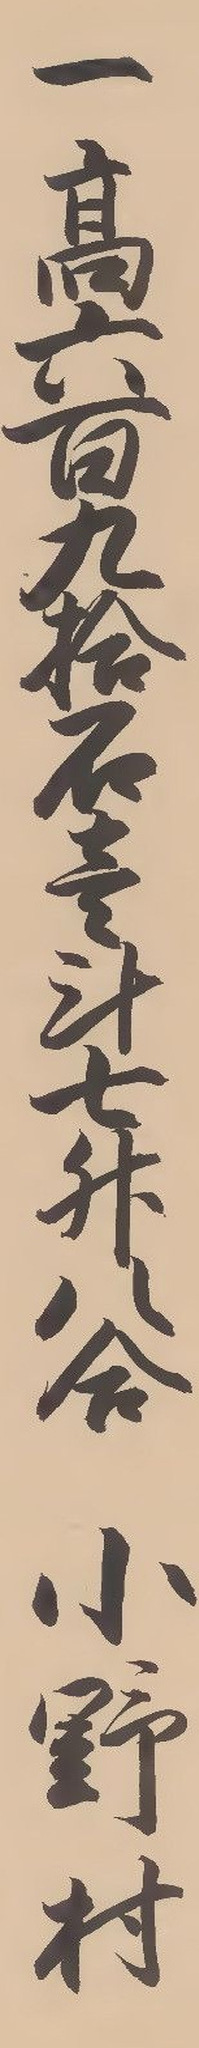一高六百九拾石壱斗七升八合小野村
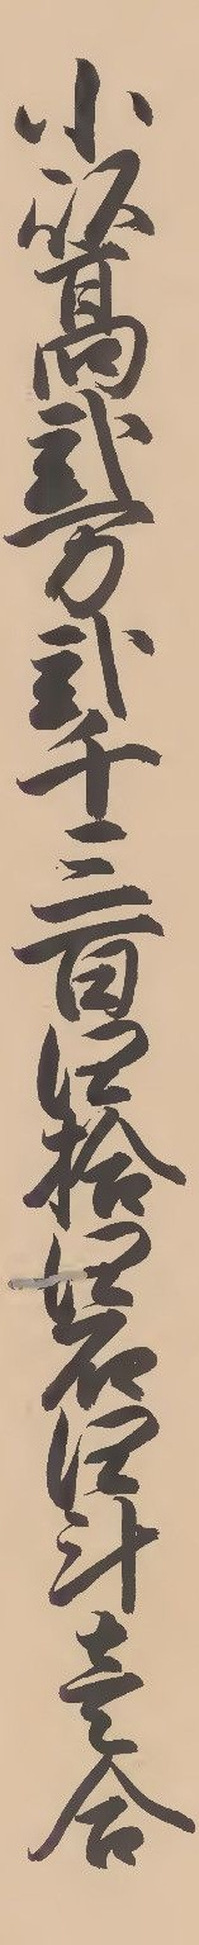小以高弐万弐千三百四拾四石四斗壱合
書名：備後国郷帳
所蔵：国立公文書館 National Archives of Japan
